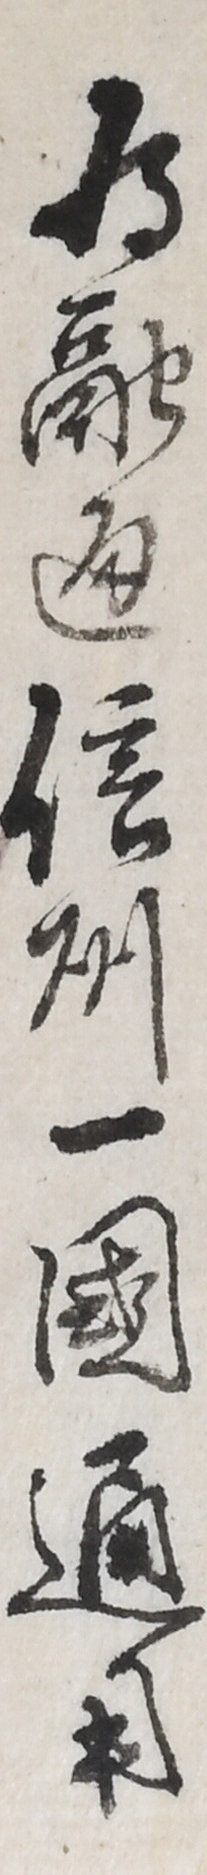為融通信州一国通用
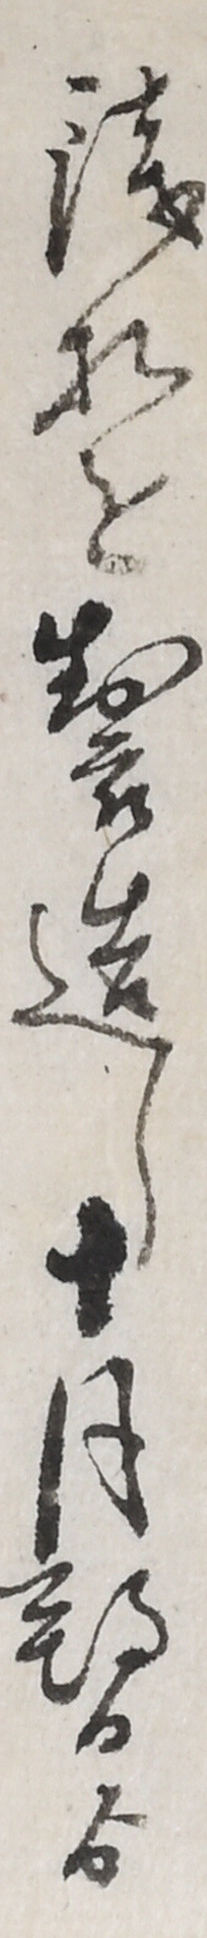銭札を製造し十月朔日ゟ
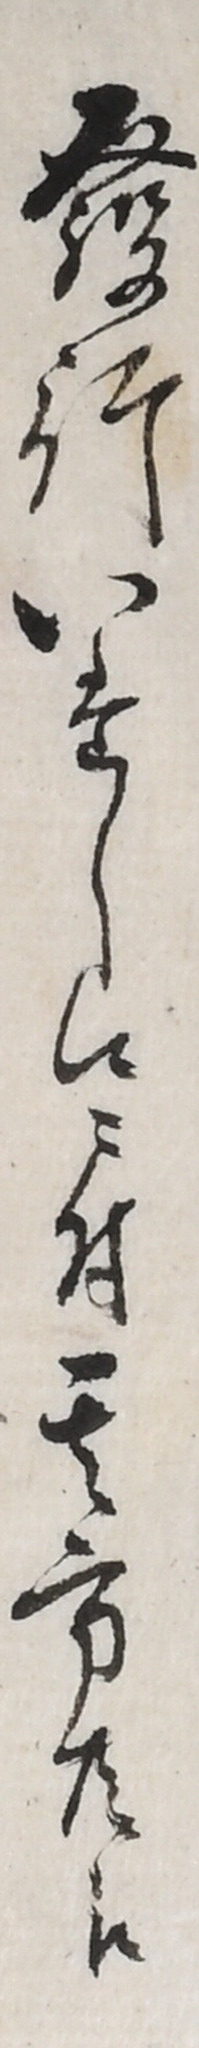発行いたし候ニ付其方共江
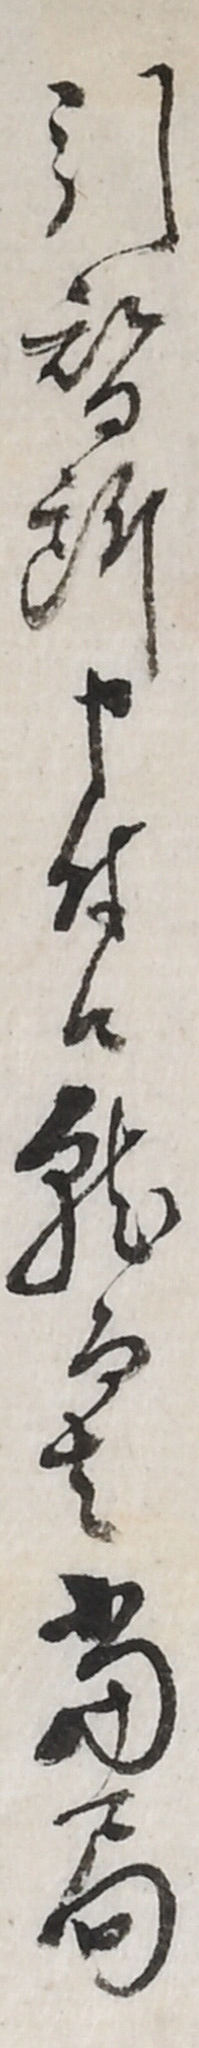引替所申付候就而者当局
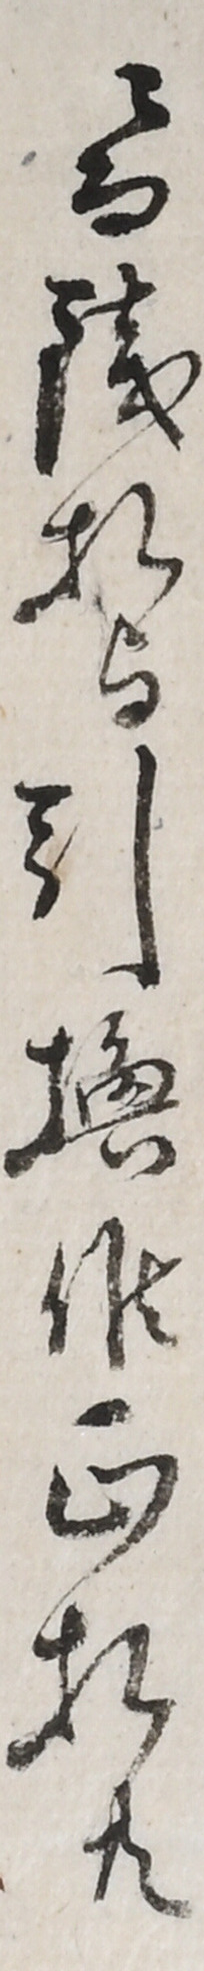ニ而銭札与引換候正札共
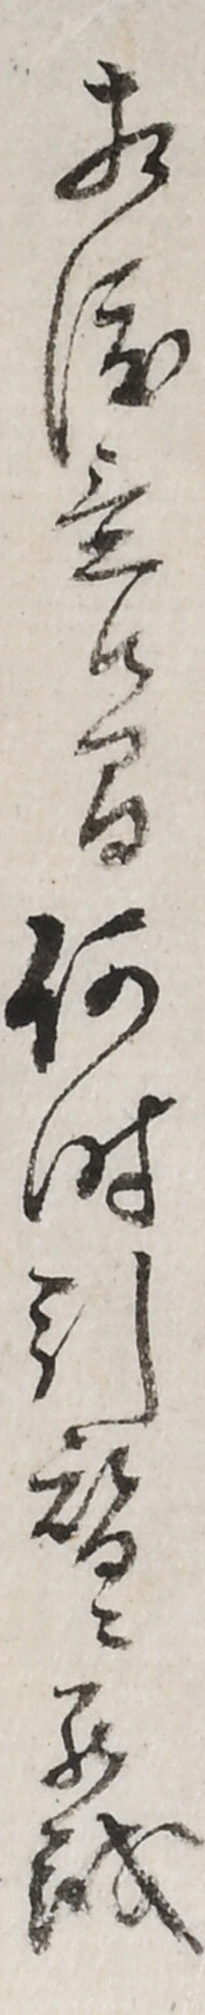相渡置候間何時引替ニ罷越
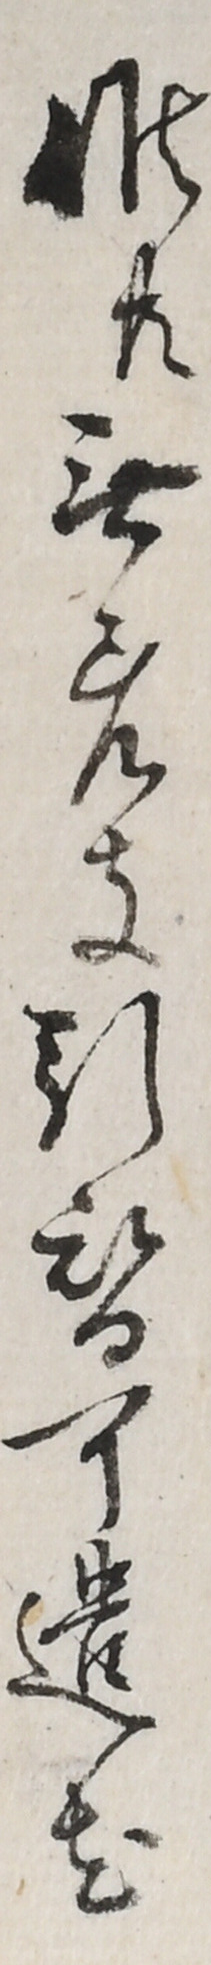候共無差支引替可遣尤
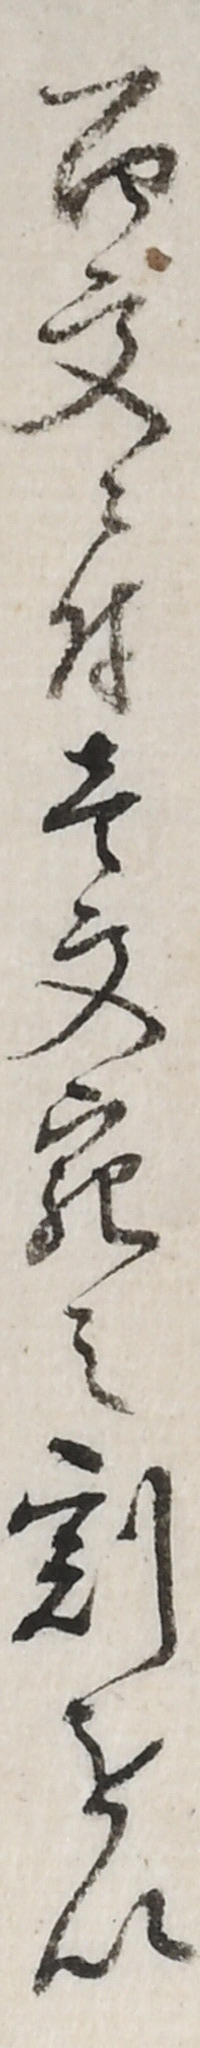百文ニ付壱文宛之割を以
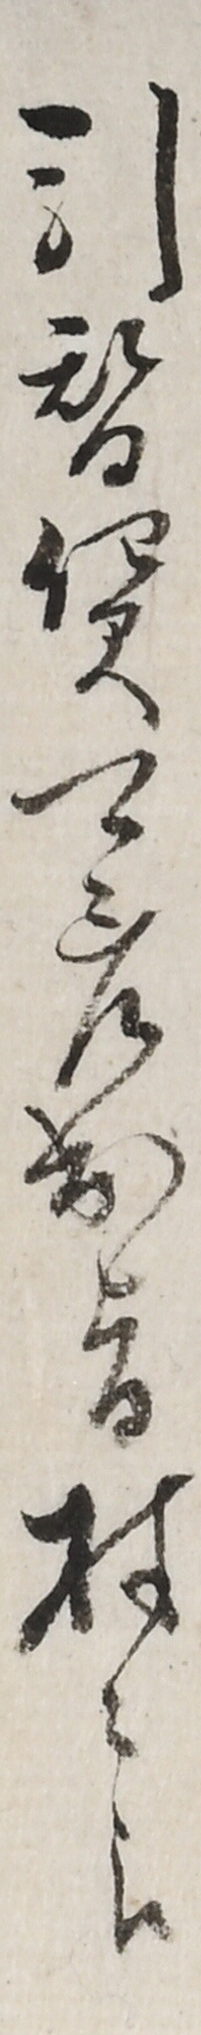引替賃可差出旨村々江
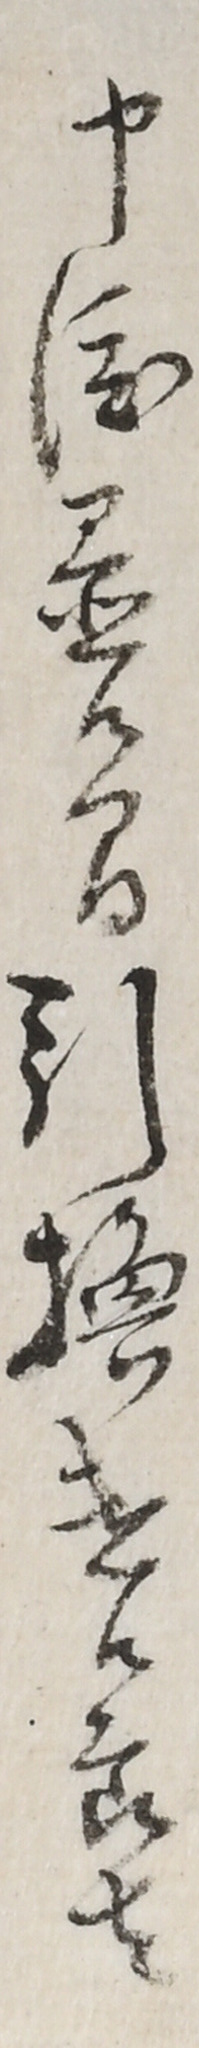申渡置候間引換遣候節者
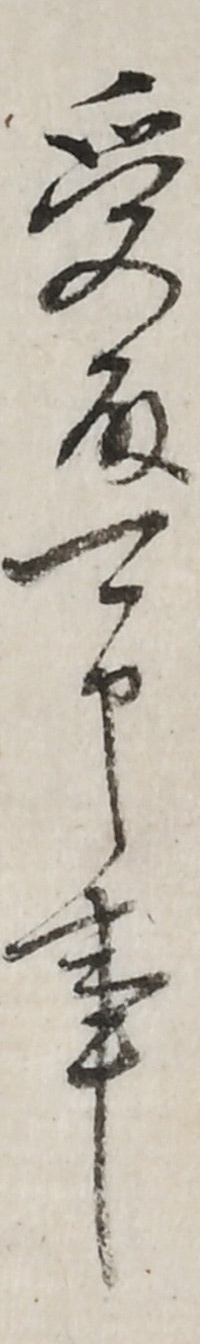受取可申事
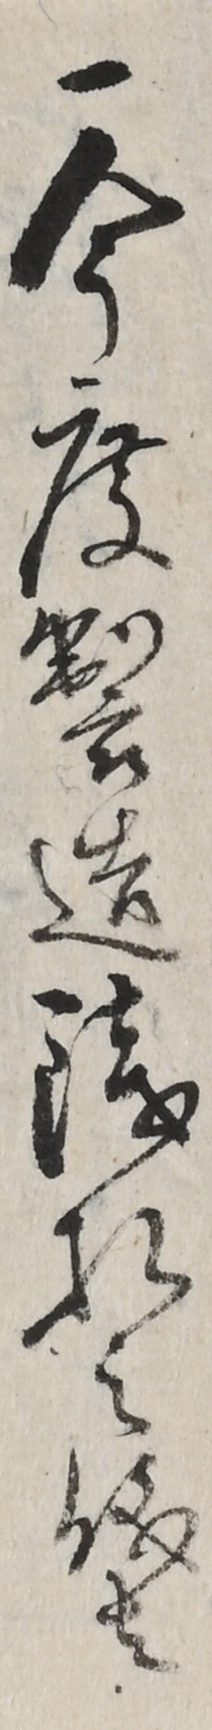一今度製造銭札之儀者
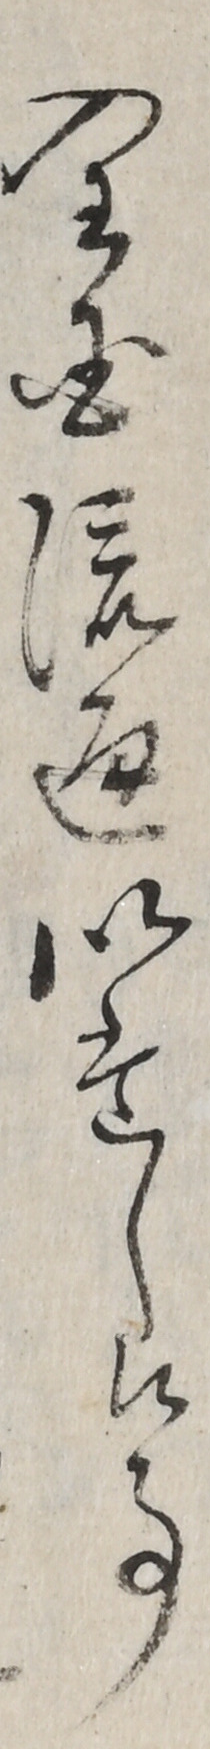金国流通いたし候事
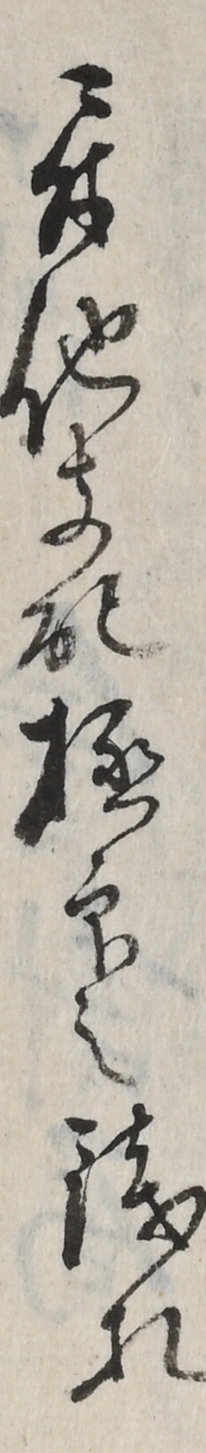ニ付他支配極印之銭札
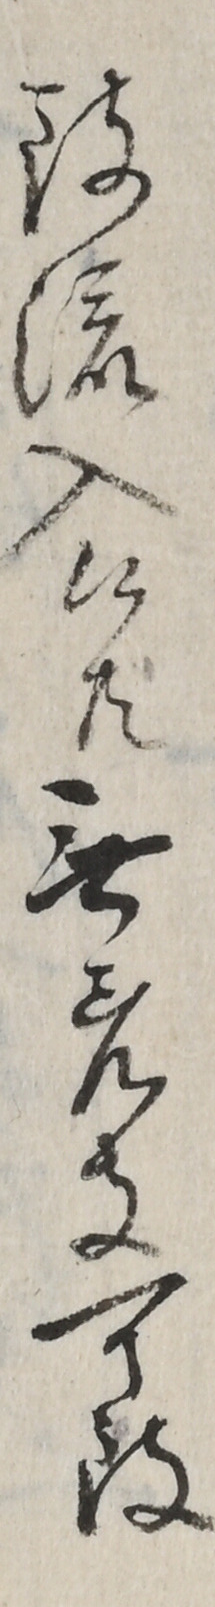致流入候共無差支可致
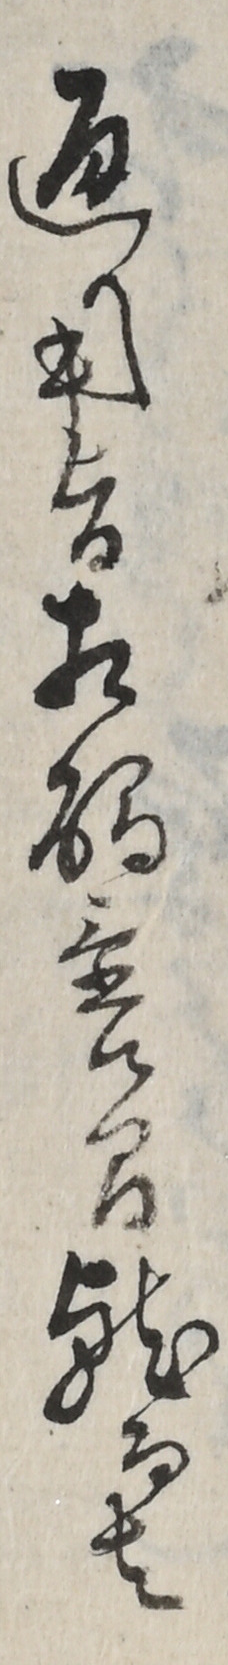通用旨相触置候間就而者
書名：信濃全國楮幣引換御用控
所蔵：伊那市立高遠町図書館・合同会社AMANE
